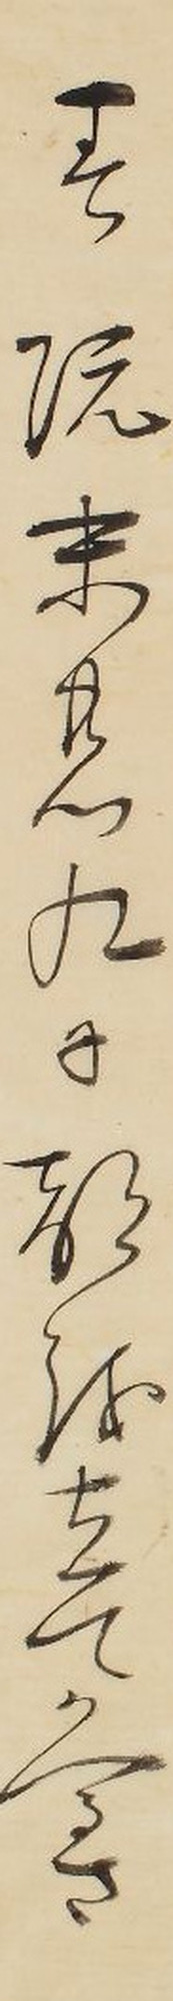春既末の九日都を立てかへるさ
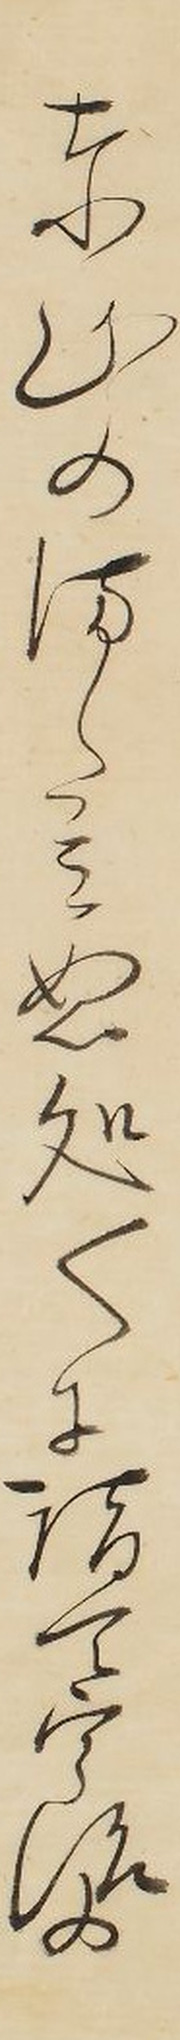東山のまたみぬ処〳〵に詣て宇治の
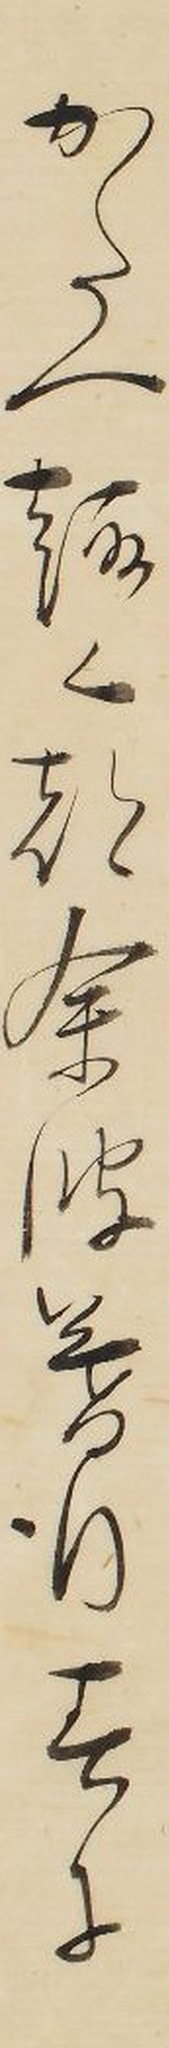かたへ趣く都余波暮行春に
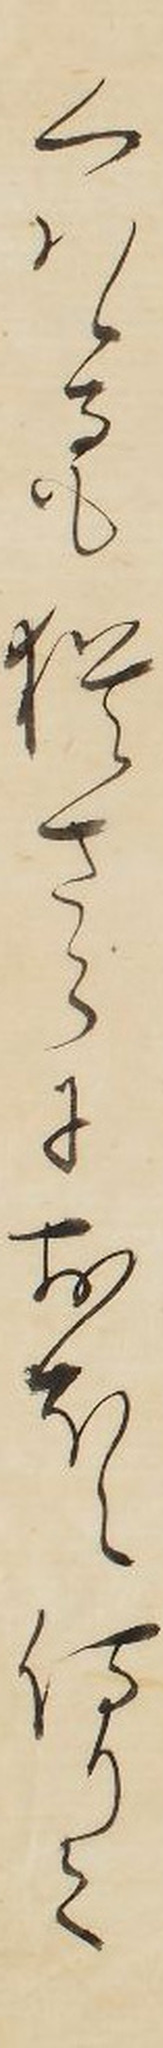くはゝるも猶さらにおほえ侍りて
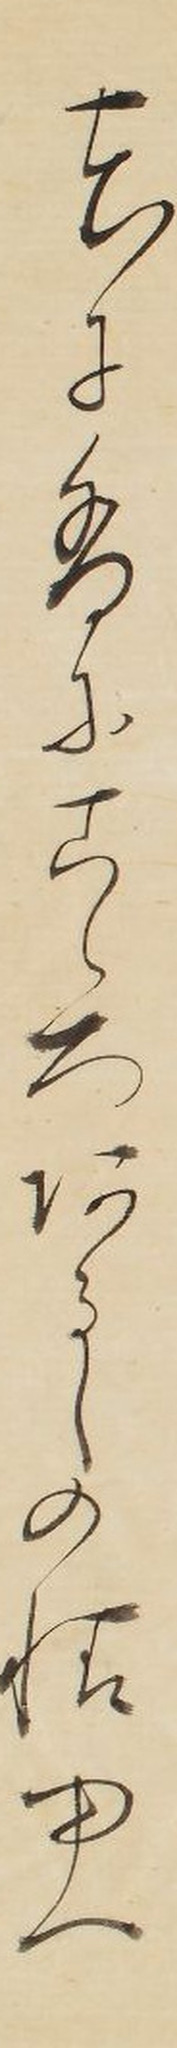花に香にこゝろあるしの情ゆへ
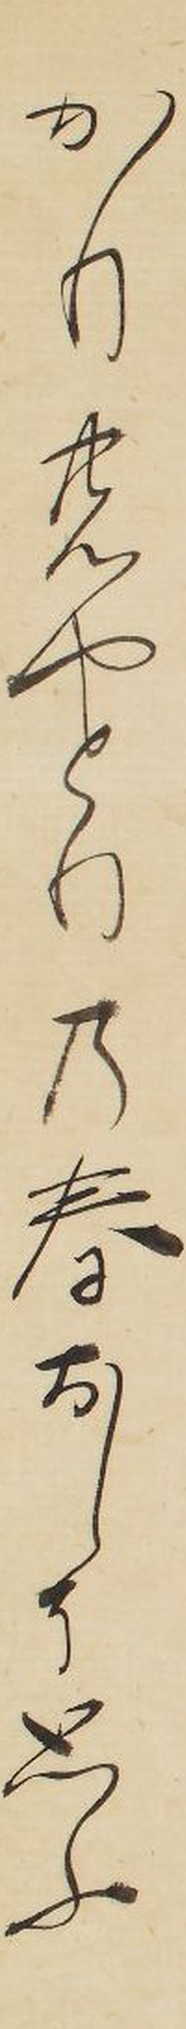かりのやとりの春おしそ思ふ

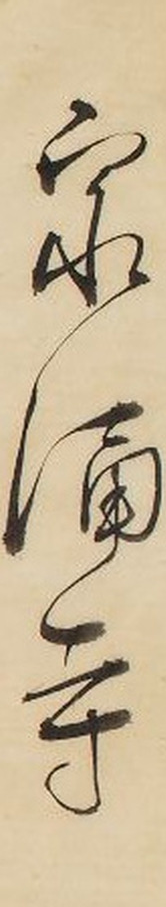泉涌寺
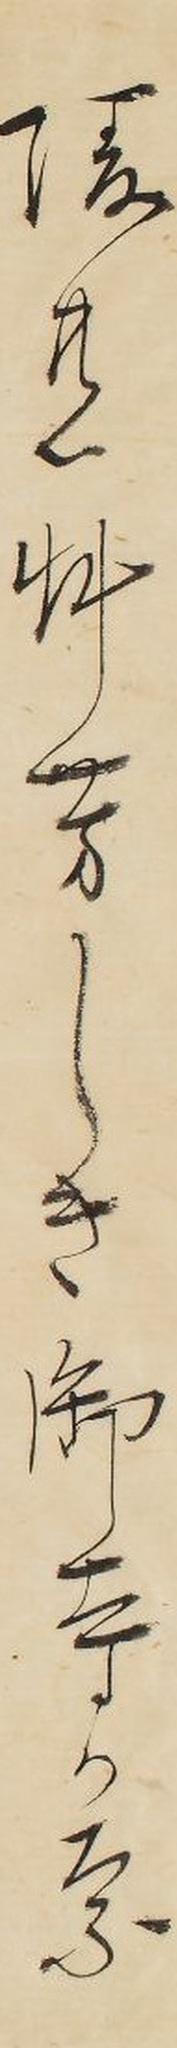陵の艸芳しき御寺かな
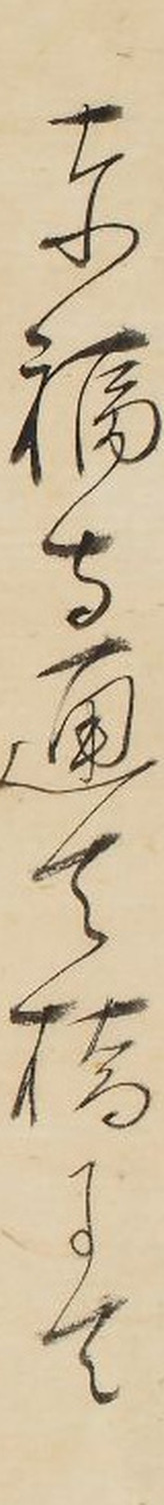東福寺通天橋にて
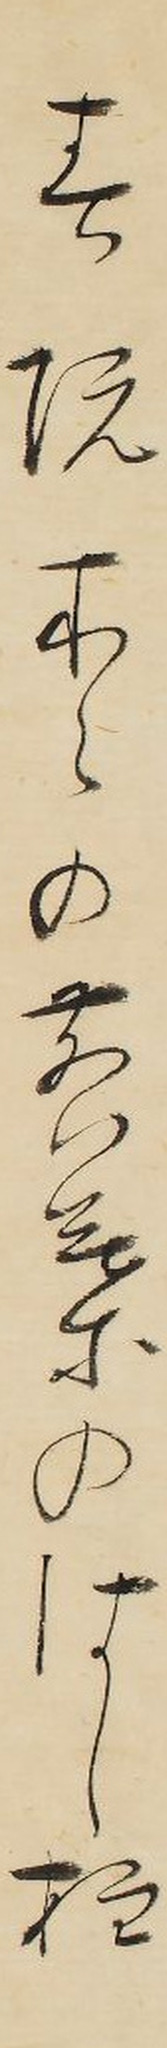春既木々の若葉のはし柱
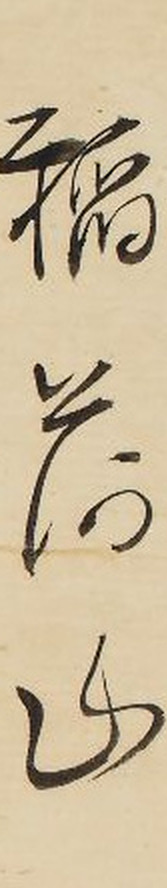稲荷山
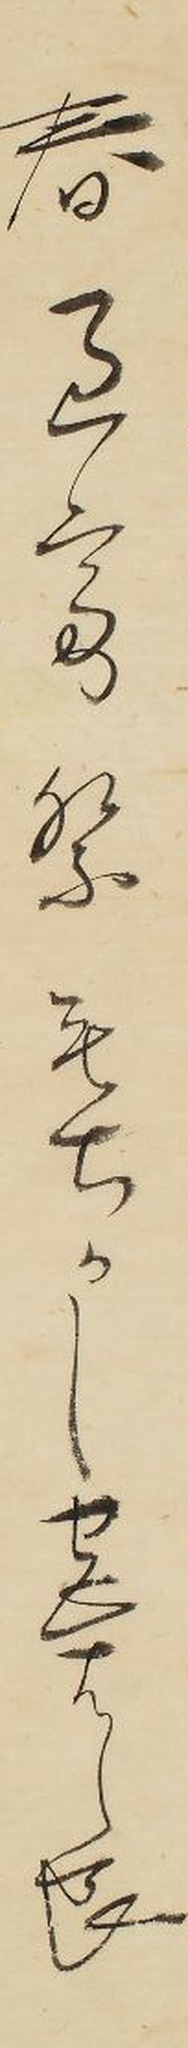春過て祭もちかし宮はしら
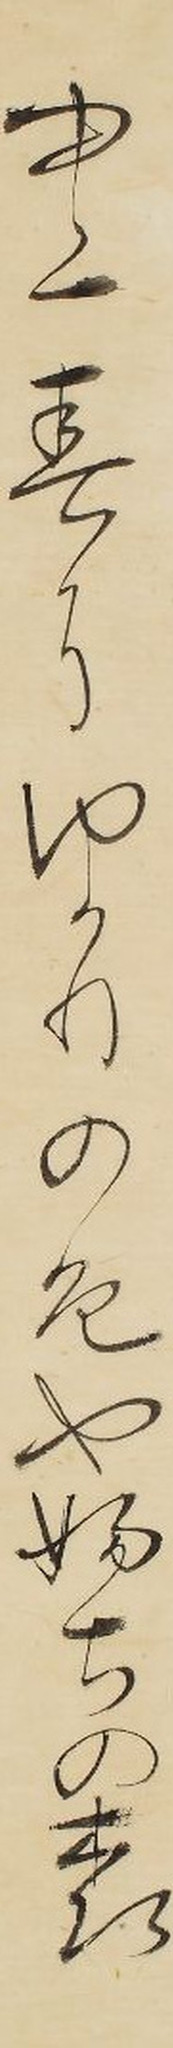ゆく春にゆかりの色やふちの森
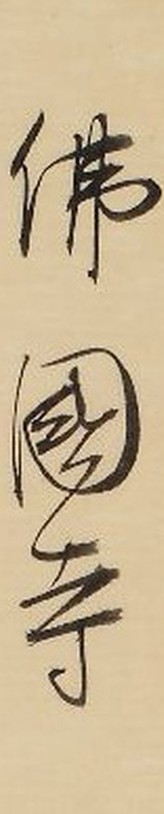仏国寺
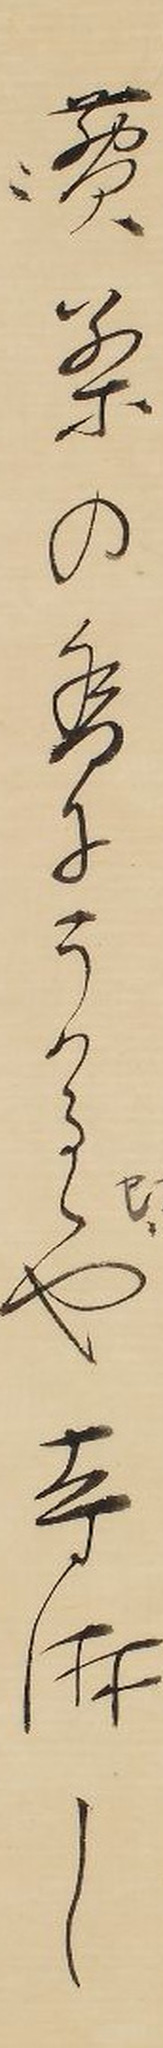普茶の香にうかるゝ蝶や寺淋し
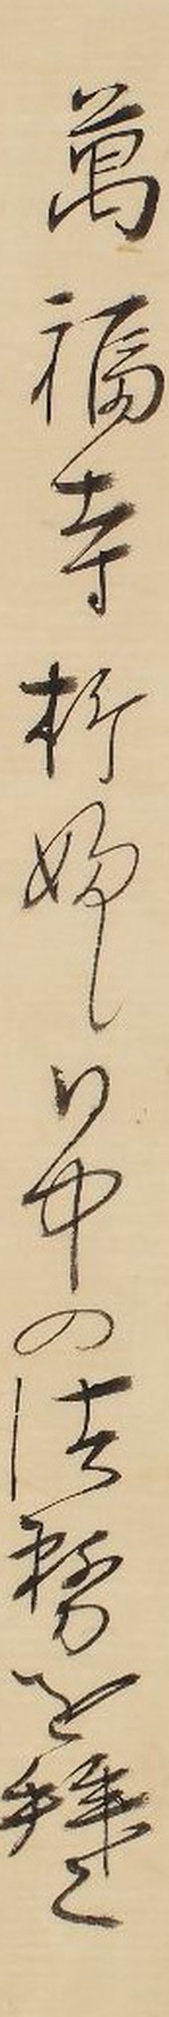万福寺折ふし日中の法務を拝て
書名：花土産
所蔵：徳島県立図書館
